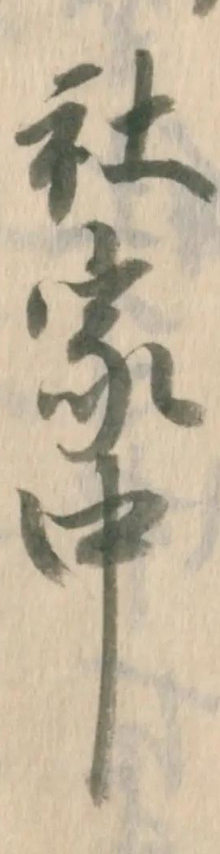社家中
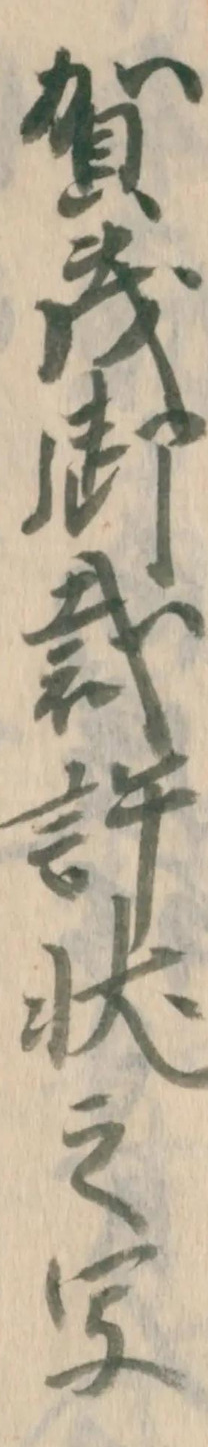賀茂御裁許状之写

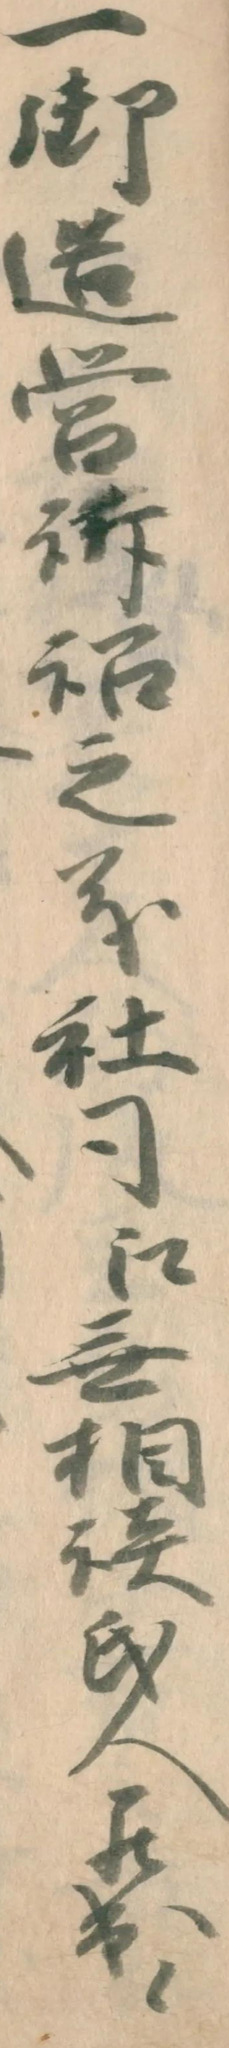一御造営訴詔之義社司え無相談氏人罷出候
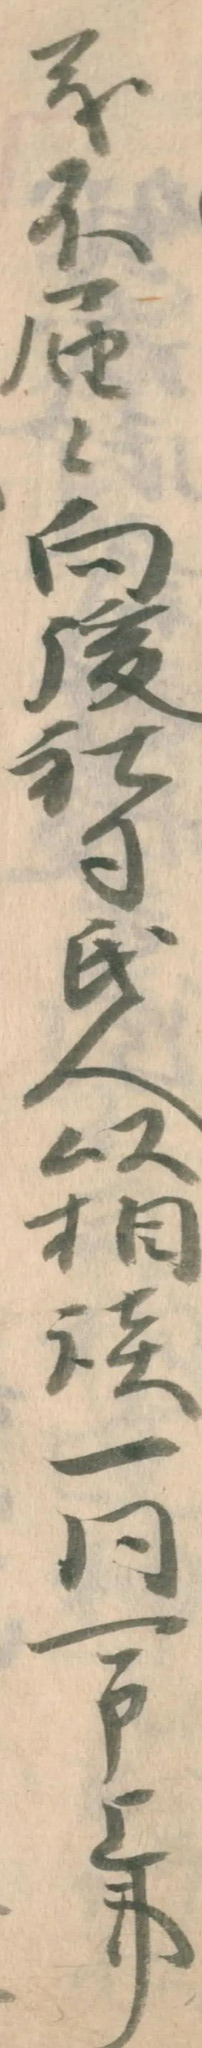義不届候向後社司氏人以相談一同可申上事
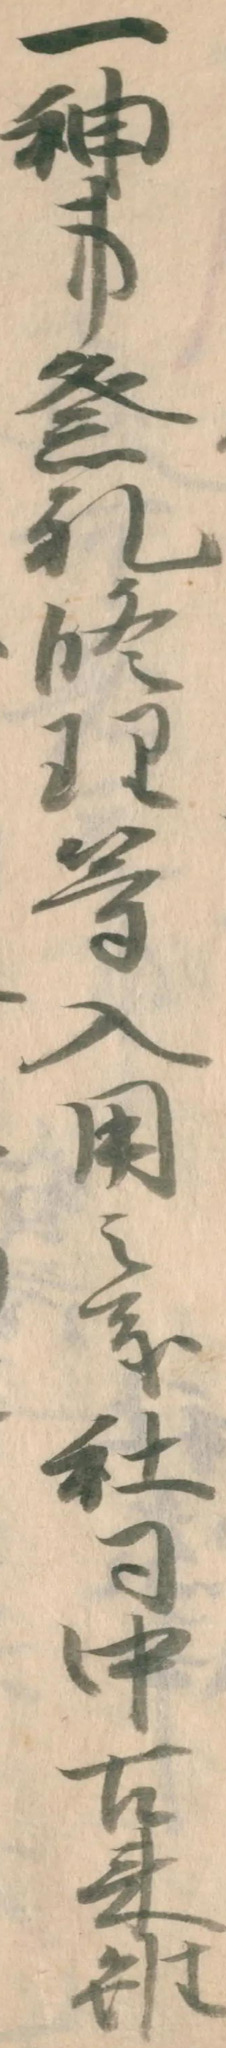一神事祭礼修理等入用之義社司中古来雖
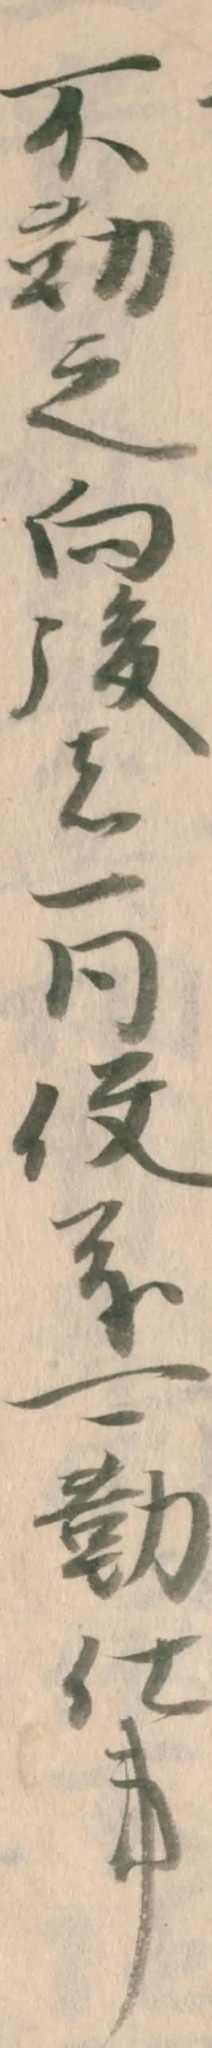不勤之向後は一同役義可勤仕事
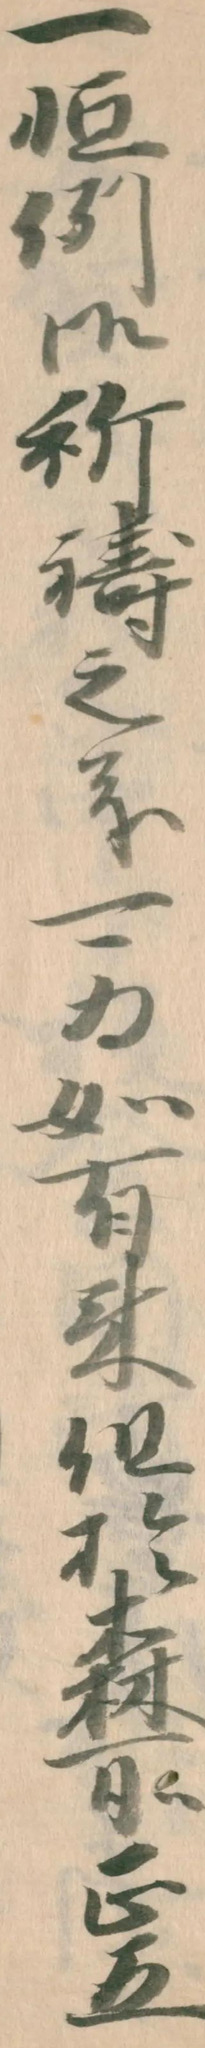一恒例御祈祷之義可為如有来但於森所正五
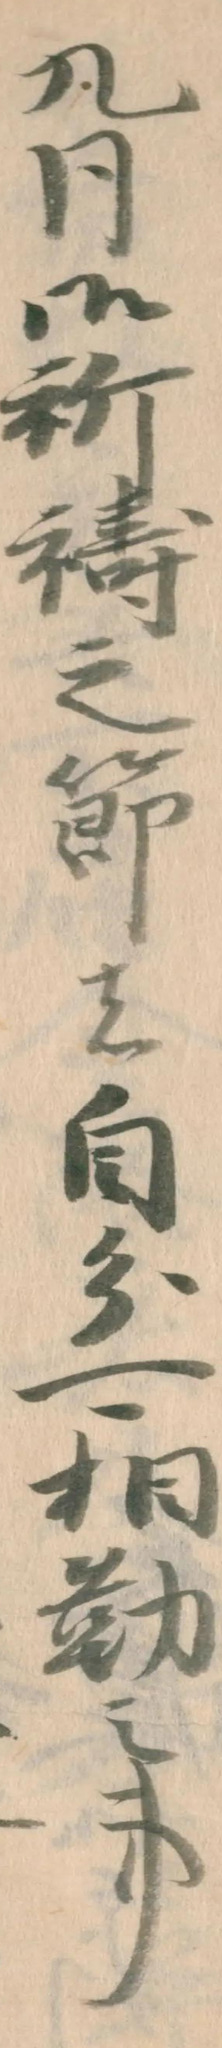九月御祈祷之節は自分可相勤之事
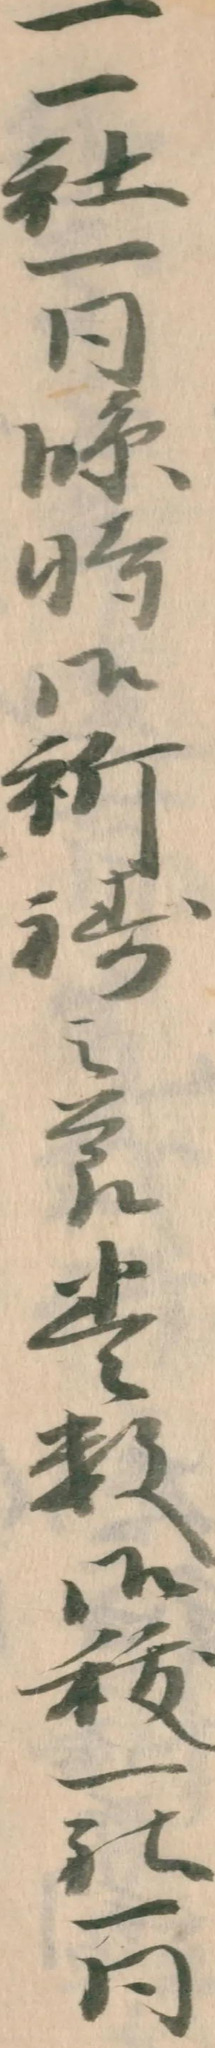一一社一同臨時御祈祷之節巻数御祓一社一同
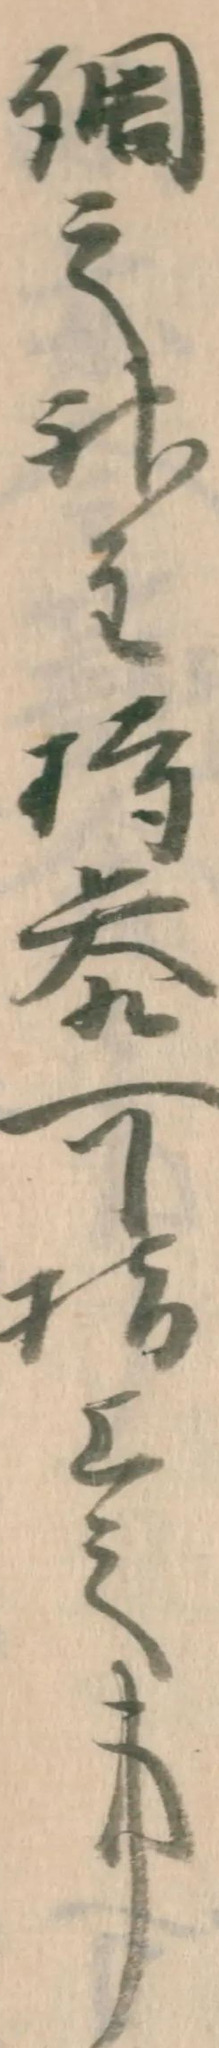調之神主持参可指上之事
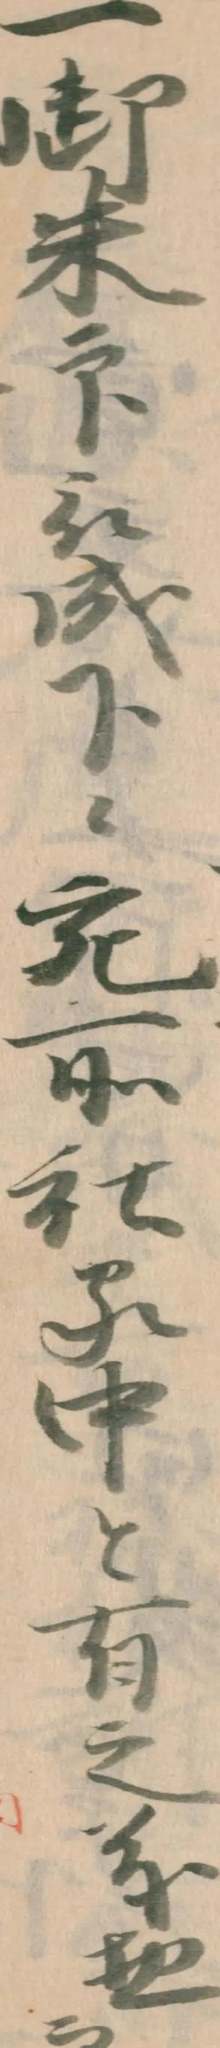一御朱印被成下候宛所社家中と有之義惣而
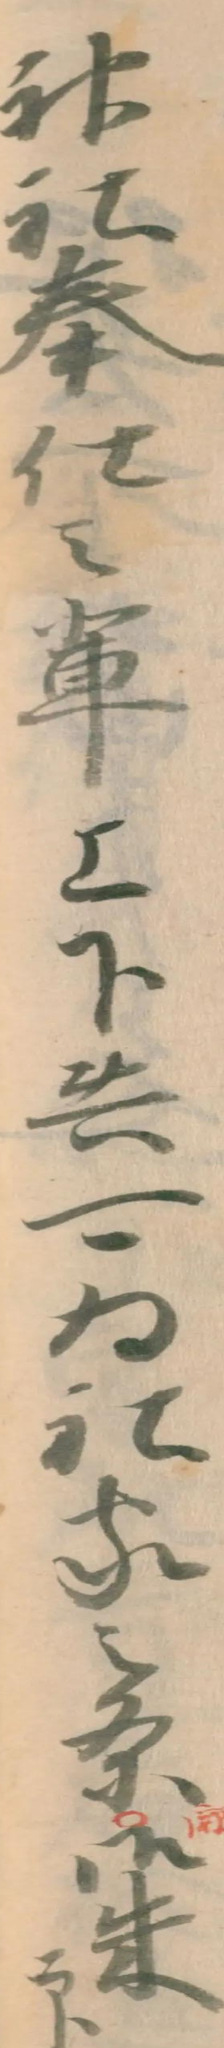神社奉仕之輩上下共可為社家之条◦御朱印
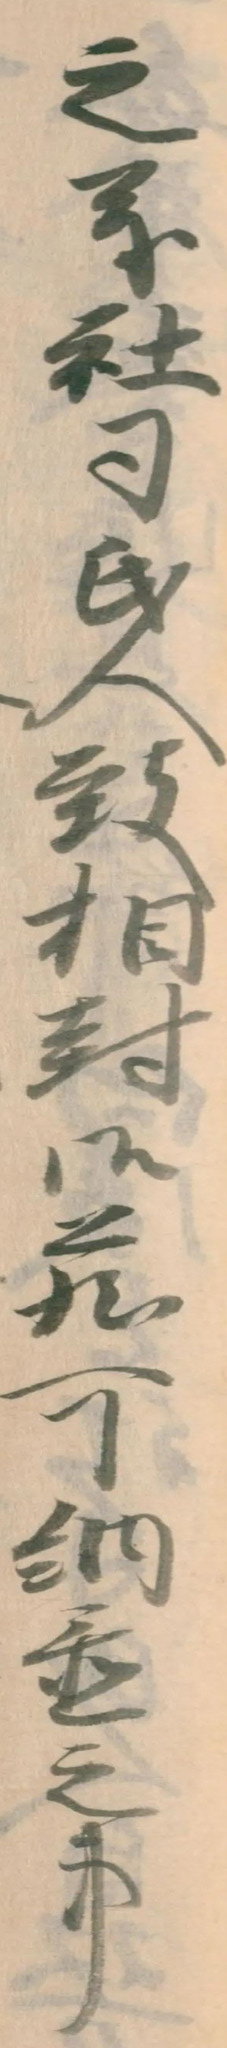之義社司氏人致相封御蔵可納置之事
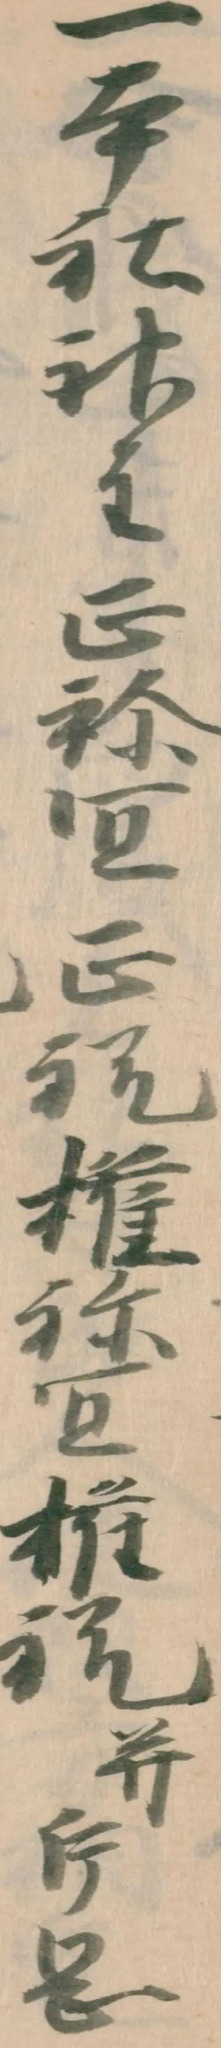一本社神主正称宜正祝権称宜権祝并片岡
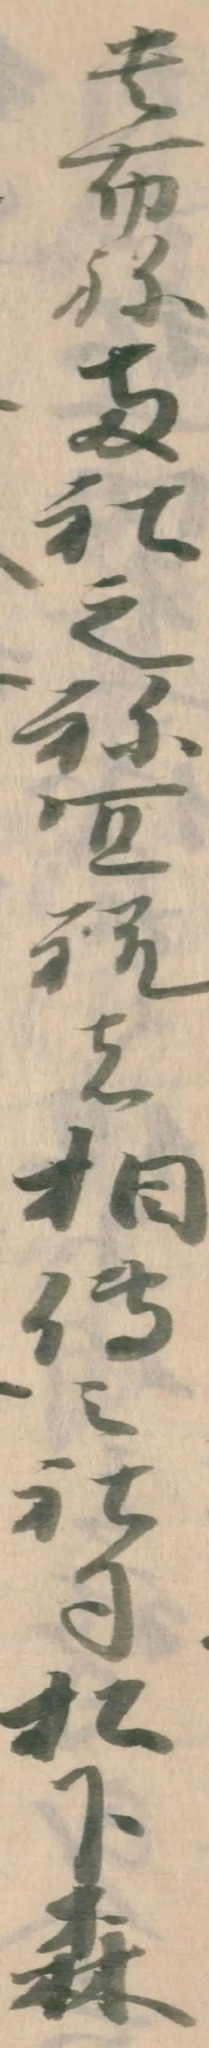貴ふね両社之祢宜祝は相伝之社司松下森
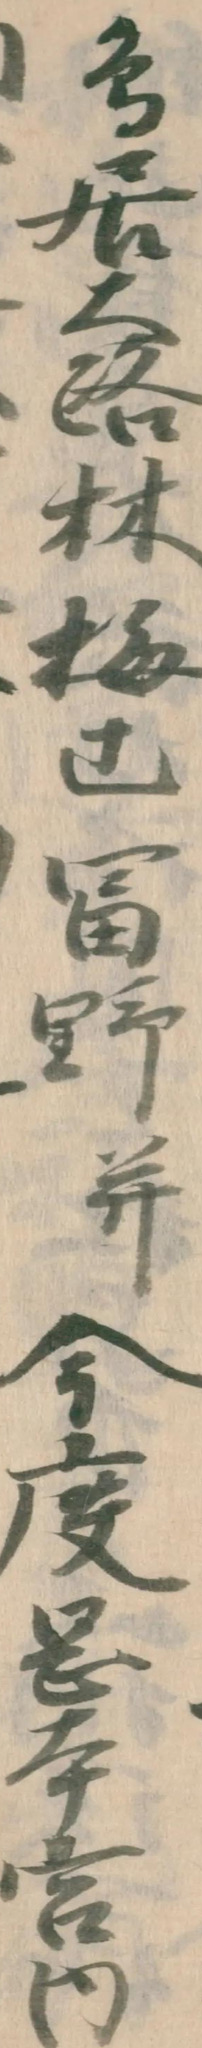鳥居大路林梅辻冨野并今度岡本宮内
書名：賀茂社記録. 第1冊
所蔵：国立国会図書館 National Diet Library, JAPAN
